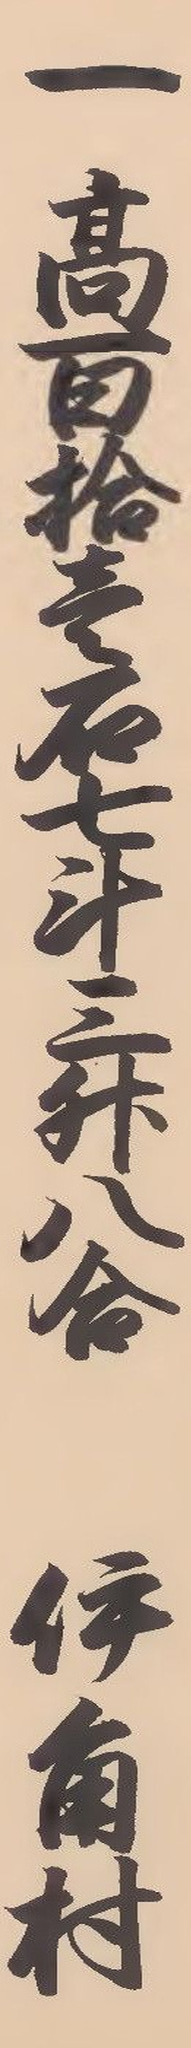一高百拾壱石七斗三升八合伊角村
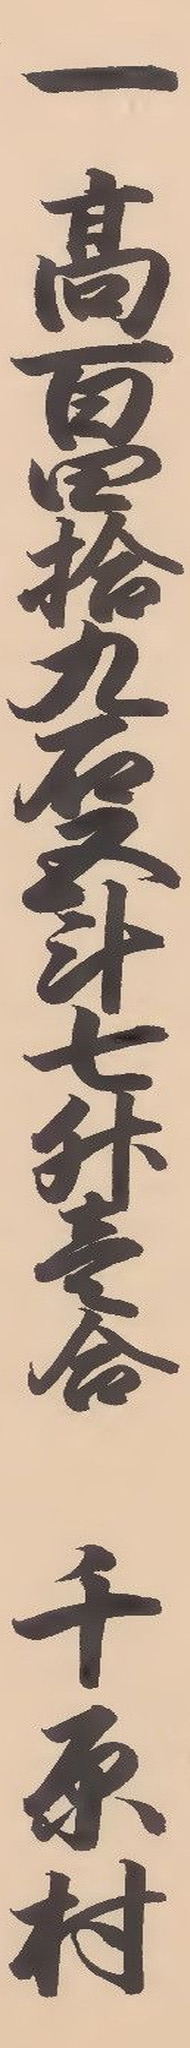一高百四拾九石五斗七升壱合千原村
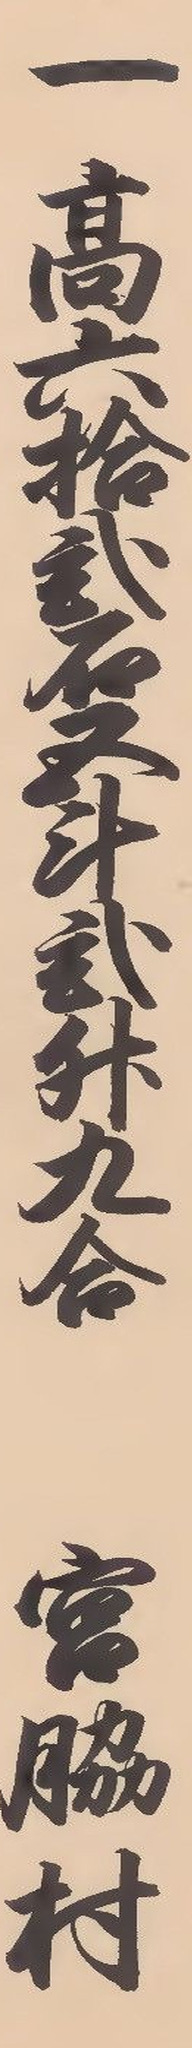一高六拾弐石五斗弐升九合宮脇村
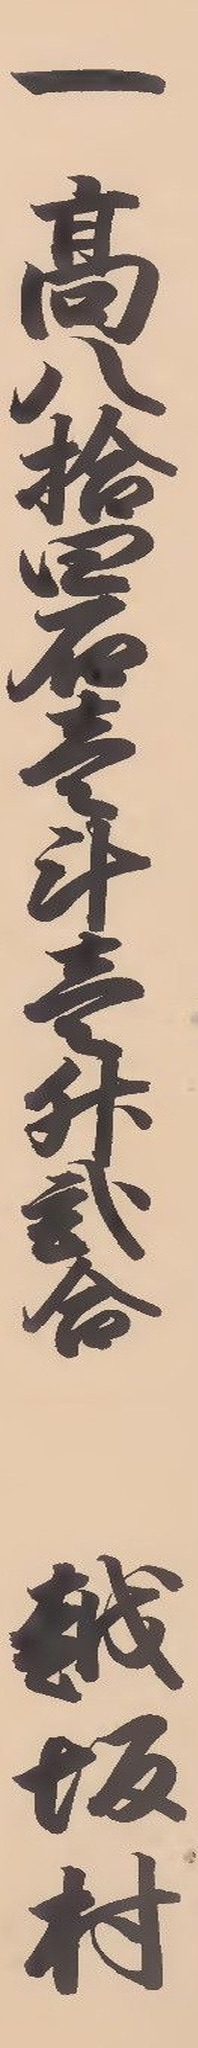一高八拾四石壱斗壱升弐合越坂村
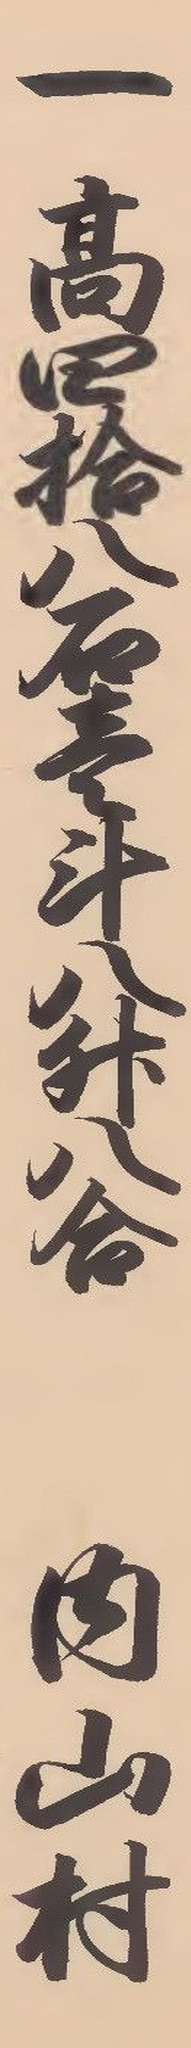一高四拾八石壱斗八升八合内山村
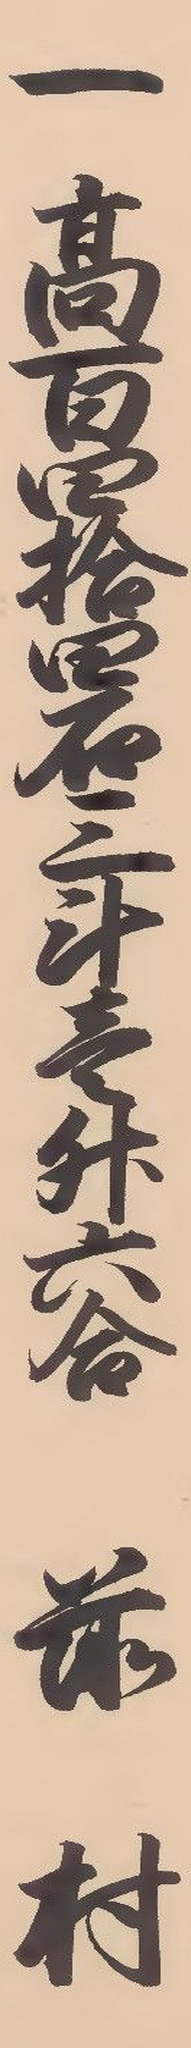一高百四拾四石三斗壱升六合前村
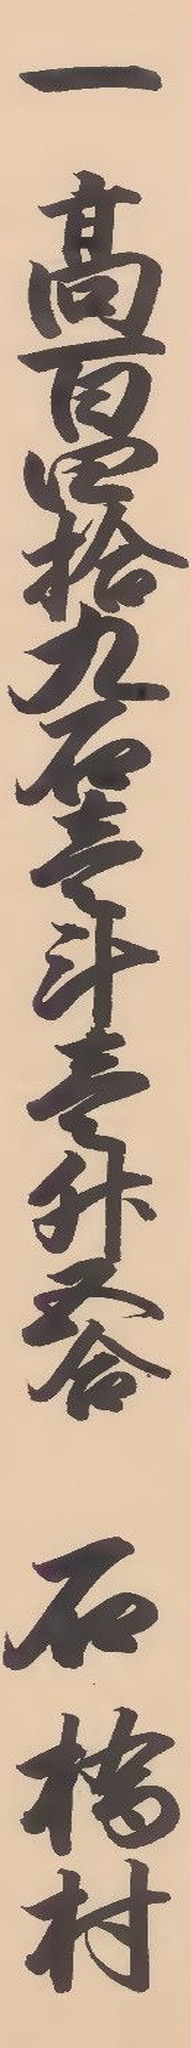一高百四拾九石壱斗壱升五合石橋村

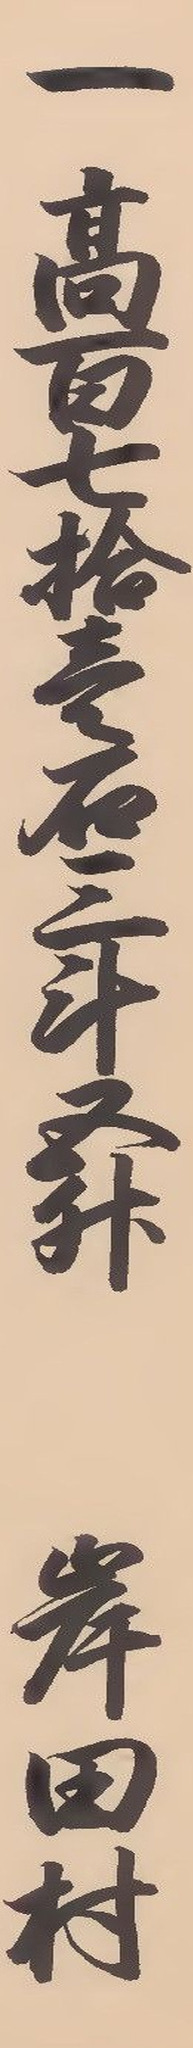一高百七拾壱石三斗五升岸田村
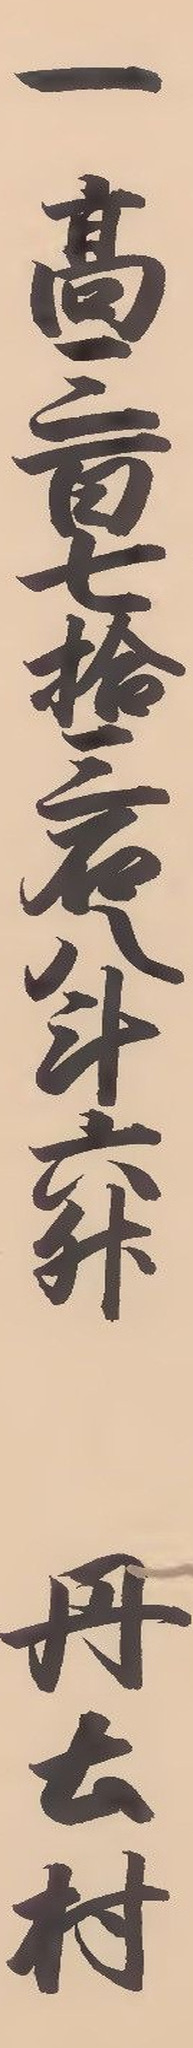一高三百七拾三石八斗六升丹土村
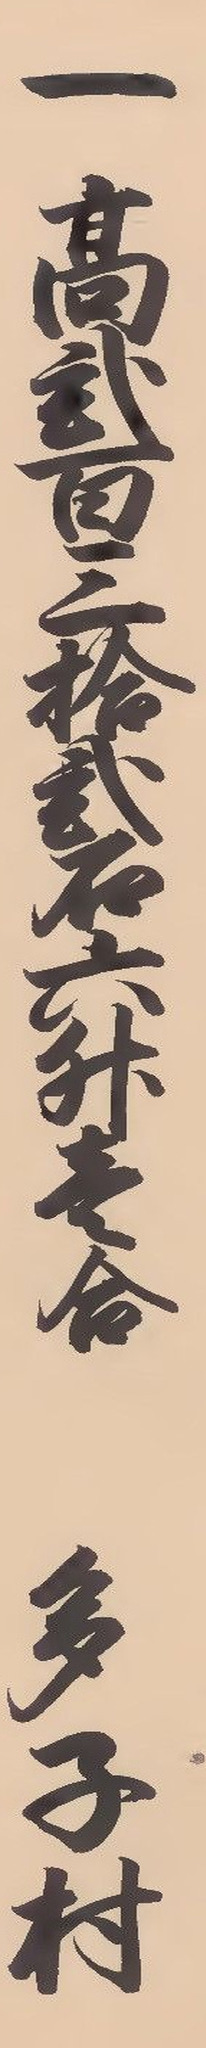一高弐百三拾弐石六升壱合多子村
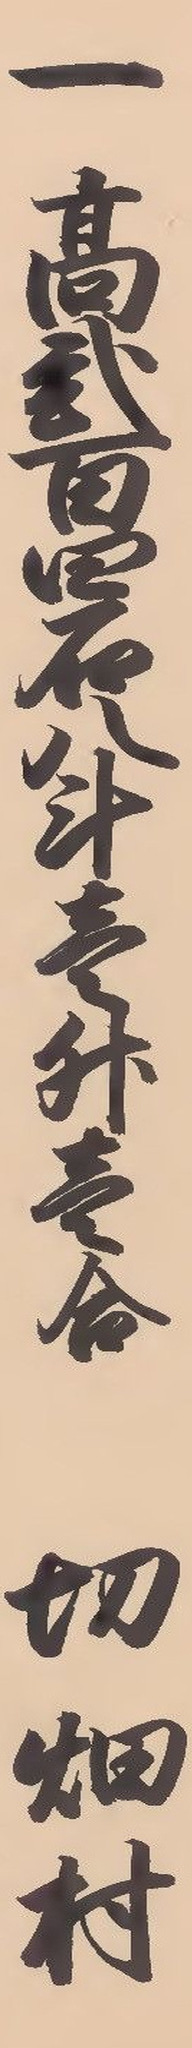一高弐百四石八斗壱升壱合切畑村
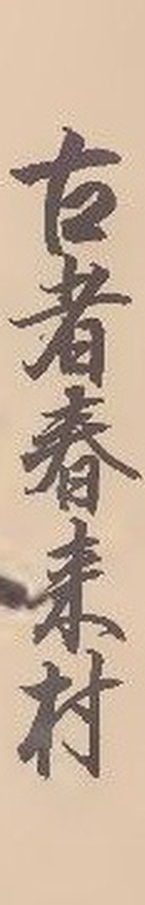古者春来村
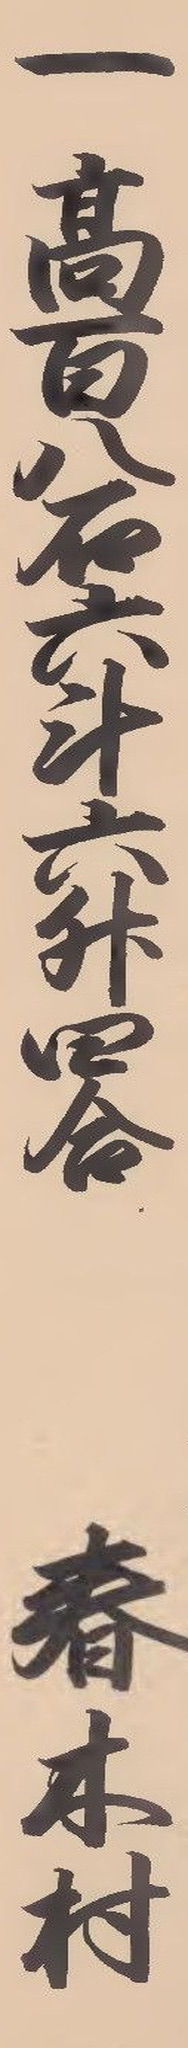一高百八石六斗六升四合春木村
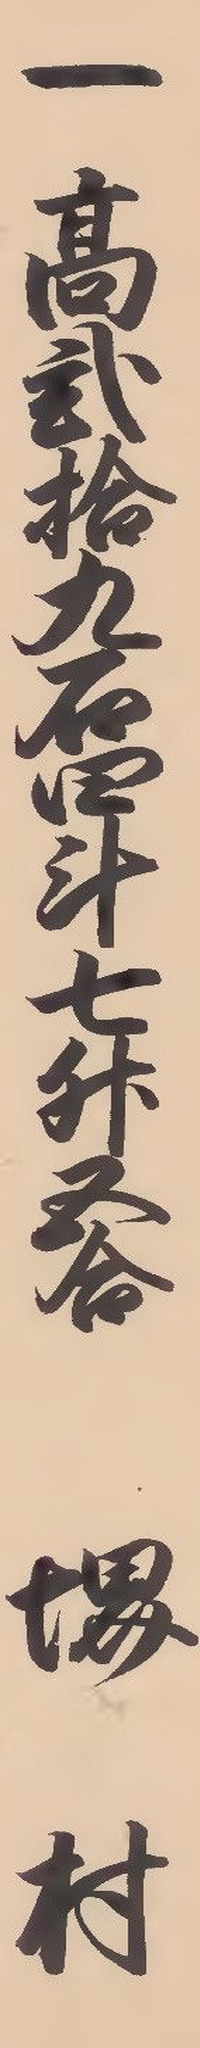一高弐拾九石四斗七升五合堺村
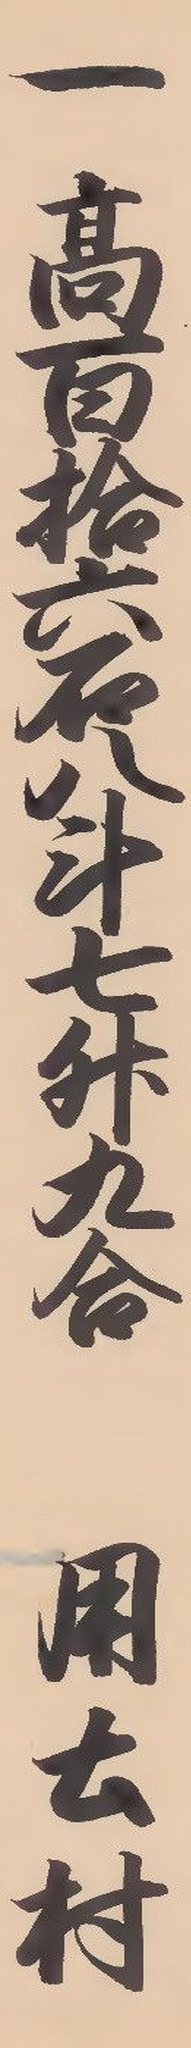一高百拾六石八斗七升九合用土村
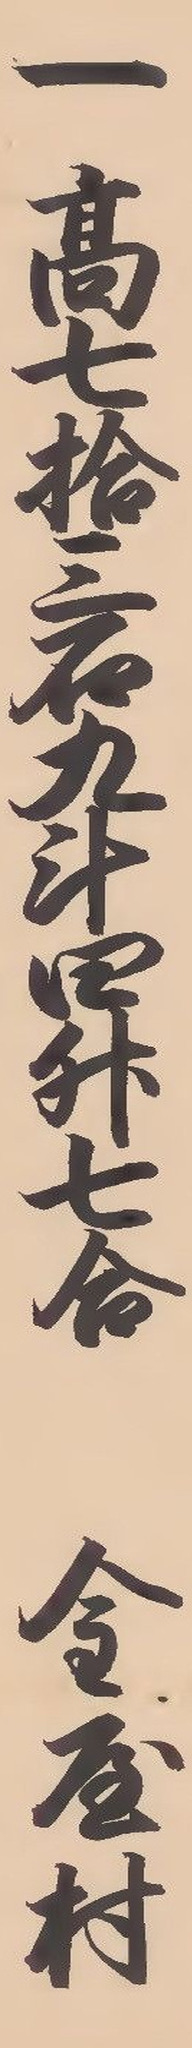一高七拾三石九斗四升七合金屋村
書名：但馬国郷帳
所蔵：国立公文書館 National Archives of Japan
